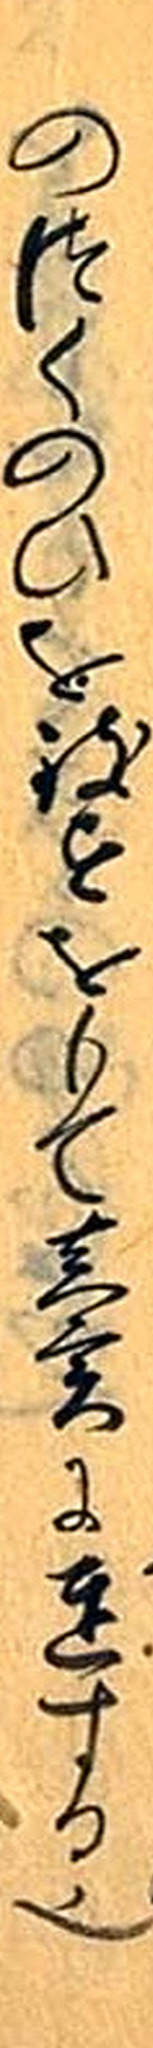のつくのひを致すをもて真実に達する也
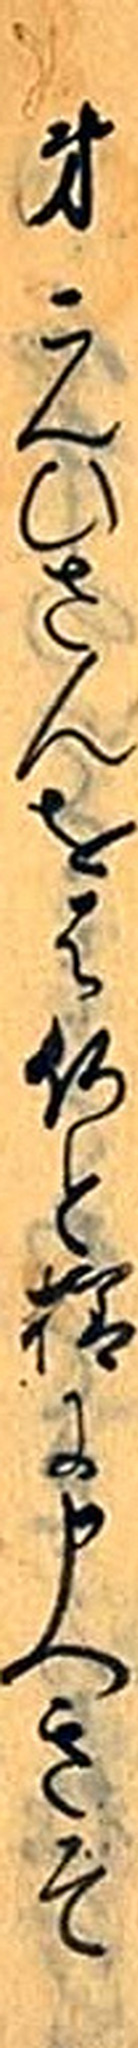弟こんひさんをは何と様に申へきそ
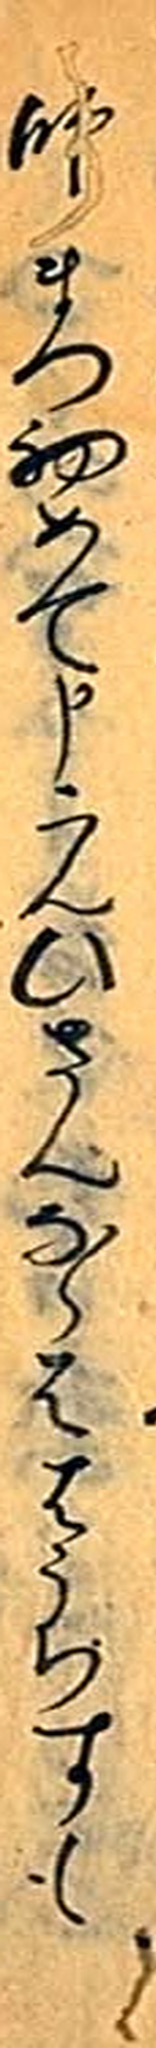師まつ初めて申こんひさんならははうちすも
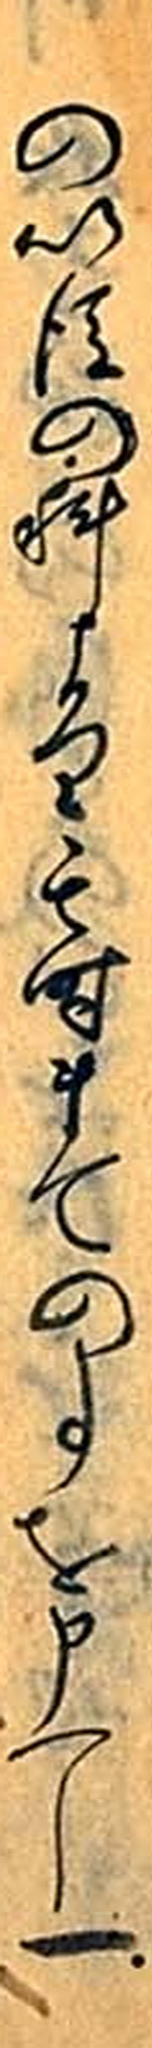の以後の科より其時まての事を申へし一
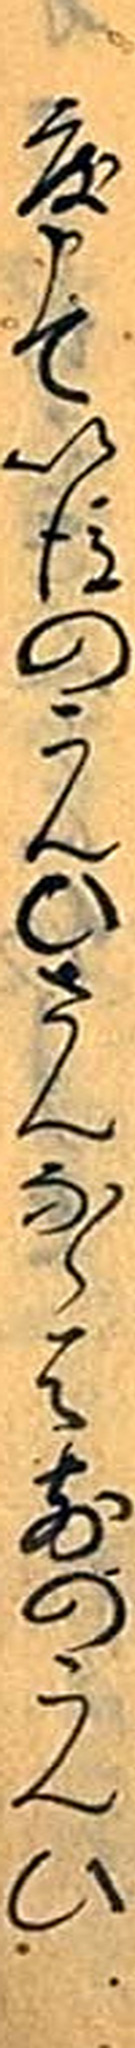度申て以後のこんひさんならは前のこんひ
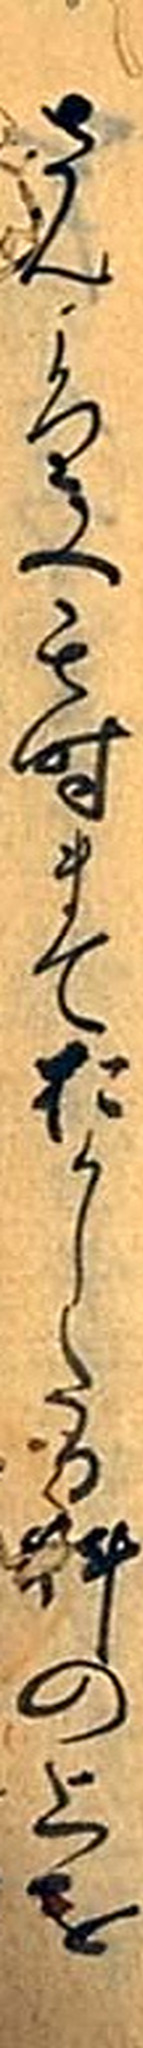さんより又其時まておかしたる科の上を
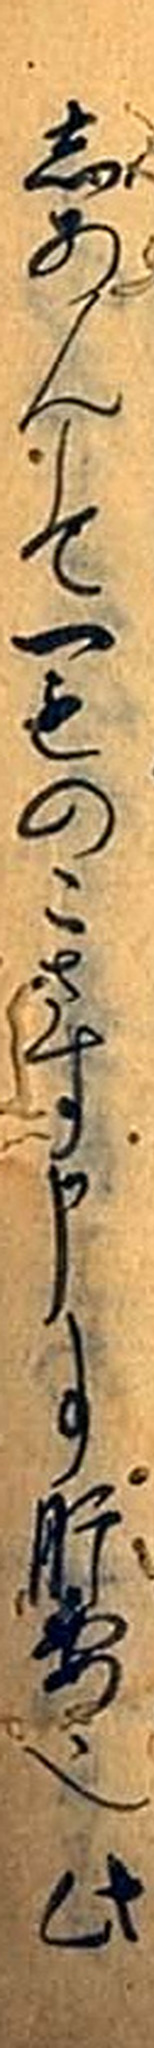しあんして一ものこさす申事肝要也此

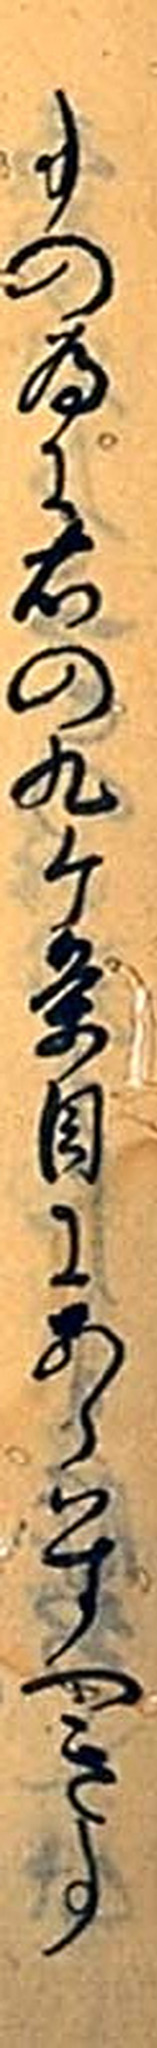事の為に右の九ケ条目にあらはすへき事
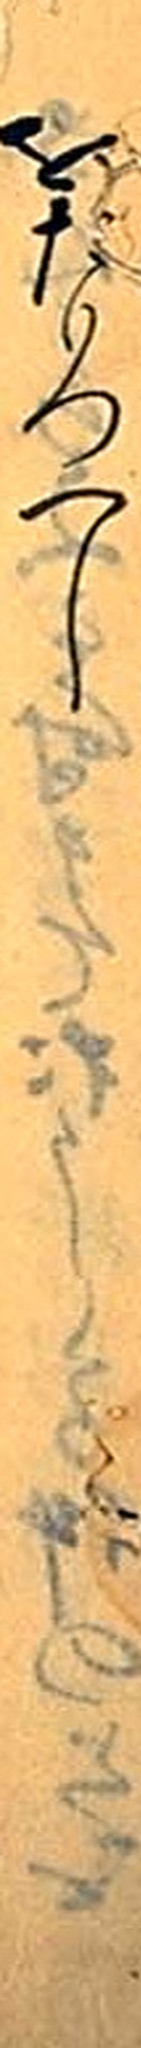をたもつへし
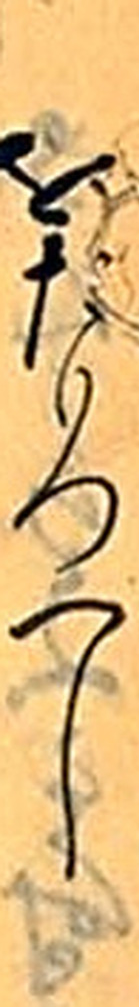をたもつへし
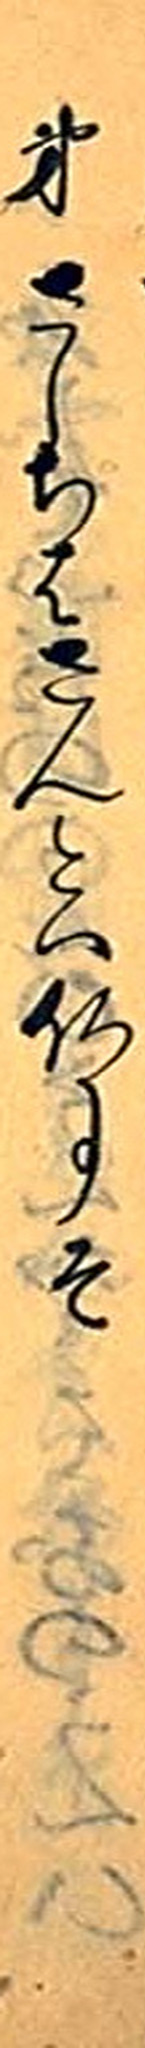弟さしちはさんとは何事そ
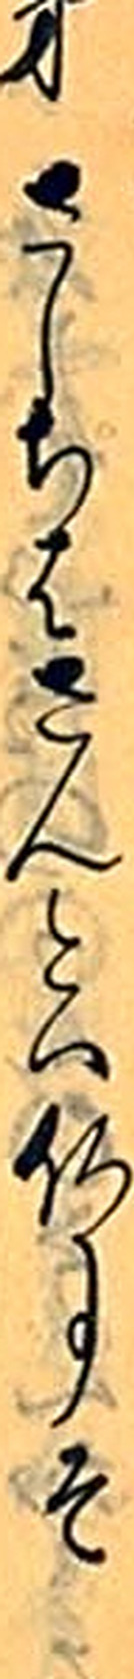弟さしちはさんとは何事そ
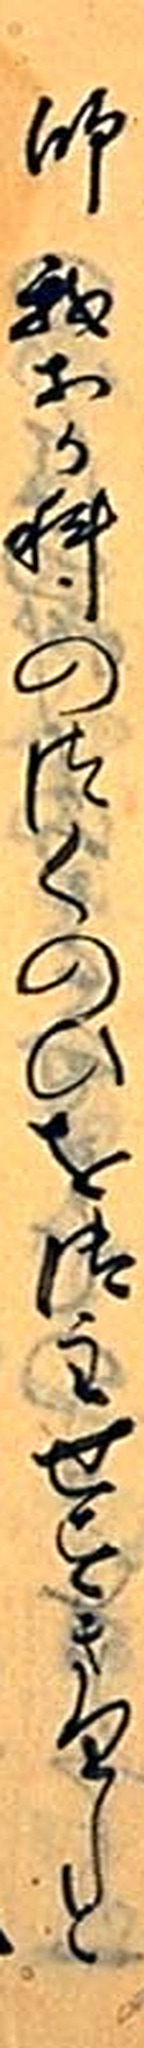師我等か科のつくのひを御主せすきりしと
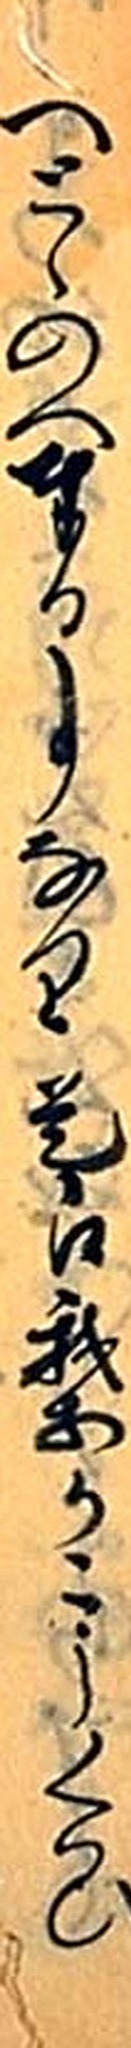へとゝのへ奉る事なり是即我等かこうくはひ
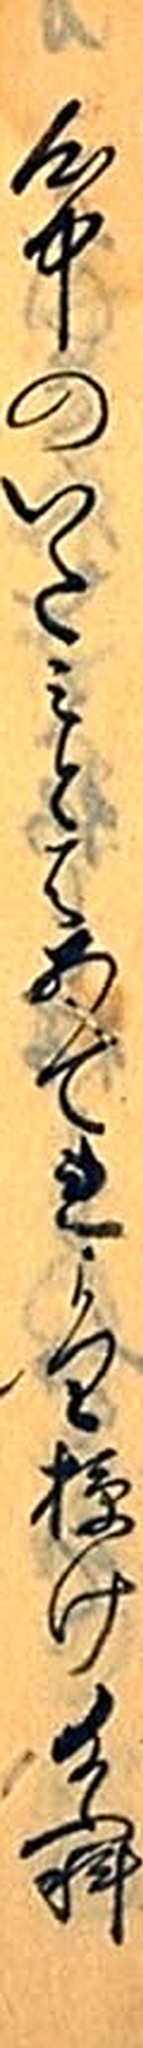心中のいたみとはあてれより授け給ふ科
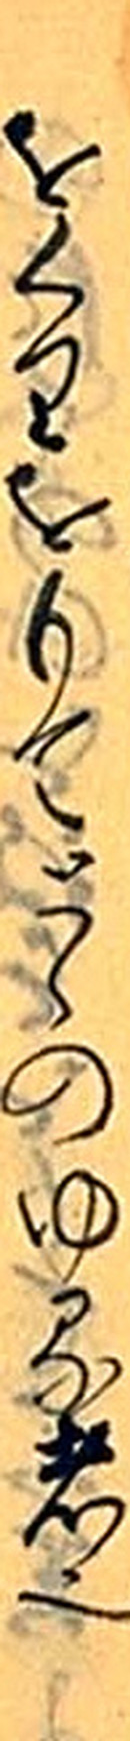をくりをもてとゝのゆる者也
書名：ドチリナ・キリシタン
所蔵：東京大学総合図書館 / General Library in the University of Tokyo
